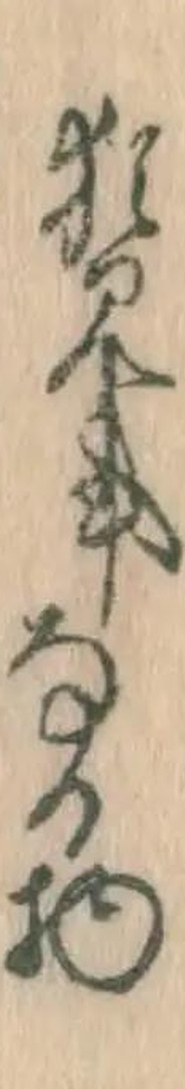猶見事なる物
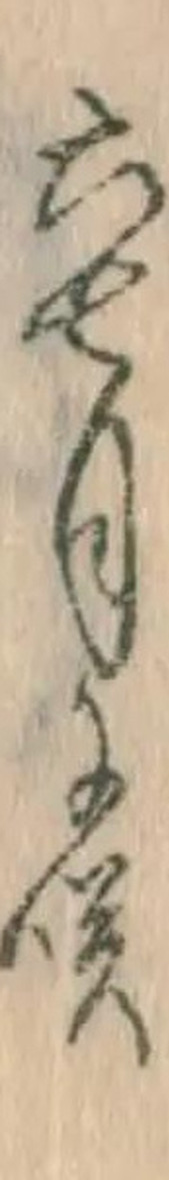六七月に咲
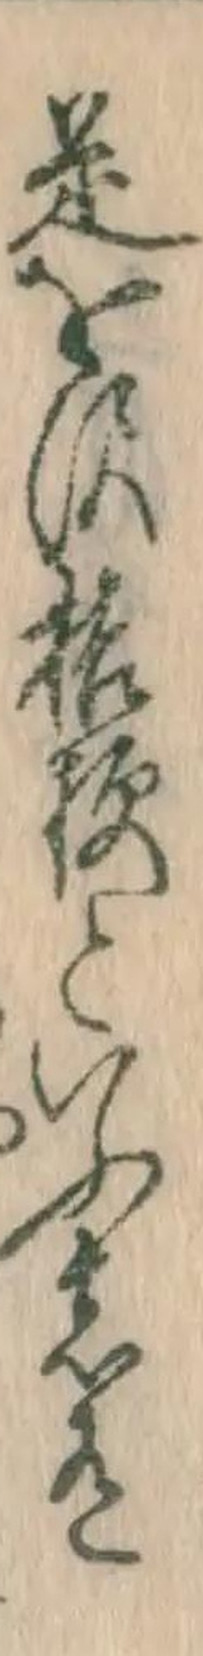是を沢桔梗といふ者有
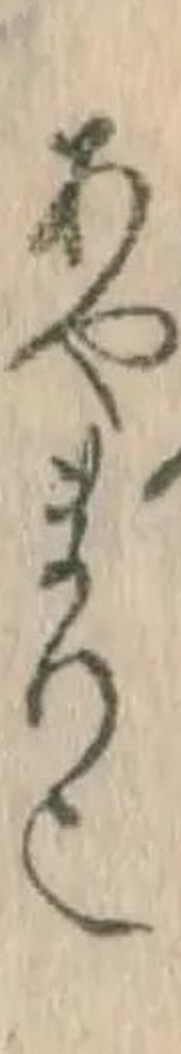あやまり也
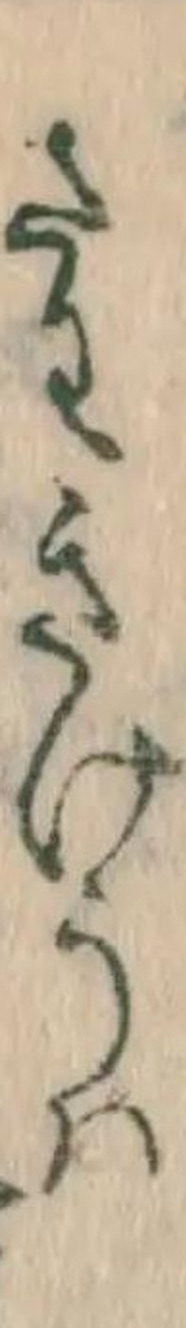さわきけうは
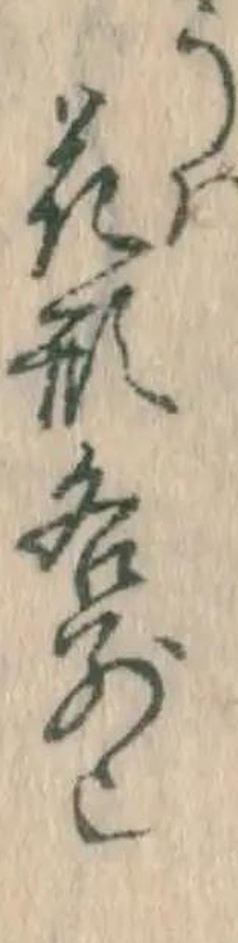花形各別也

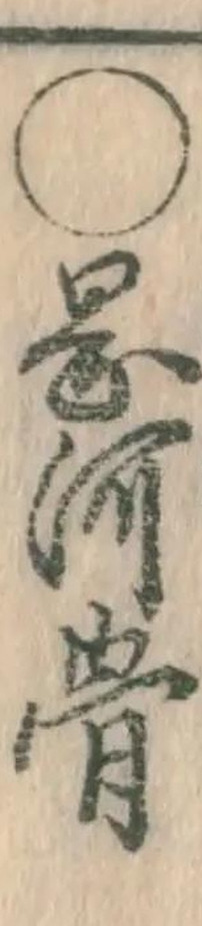〇岡河骨
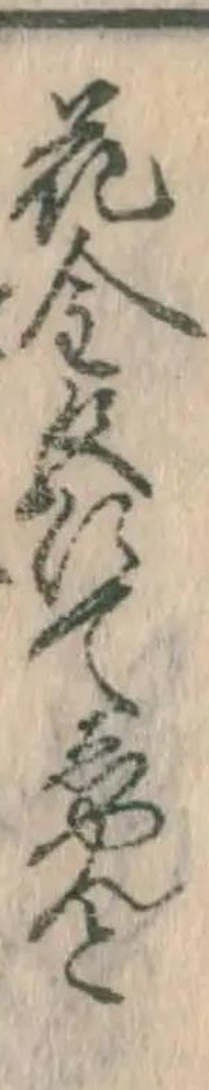花金色にてしゆんと
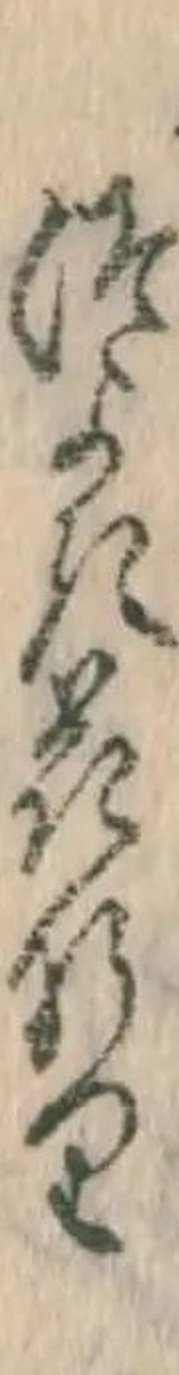つよき花なり
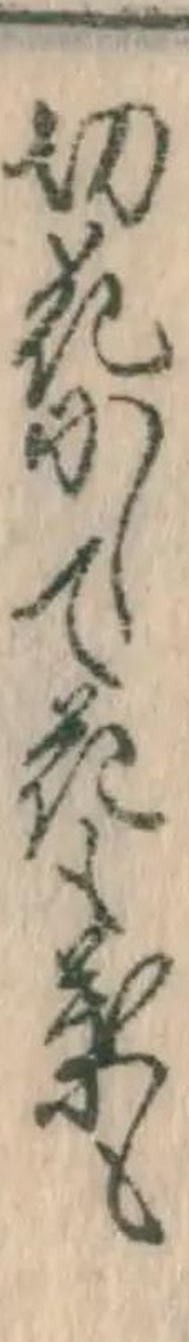切花にして花も葉も
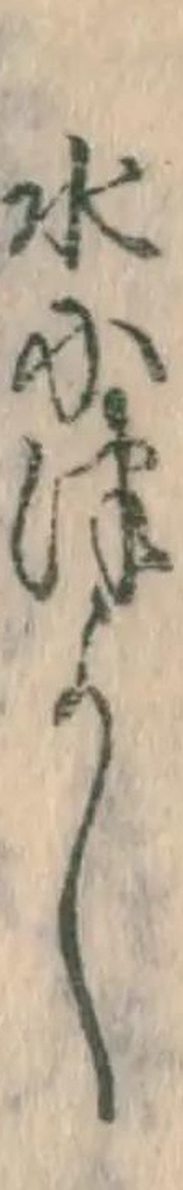水につよく
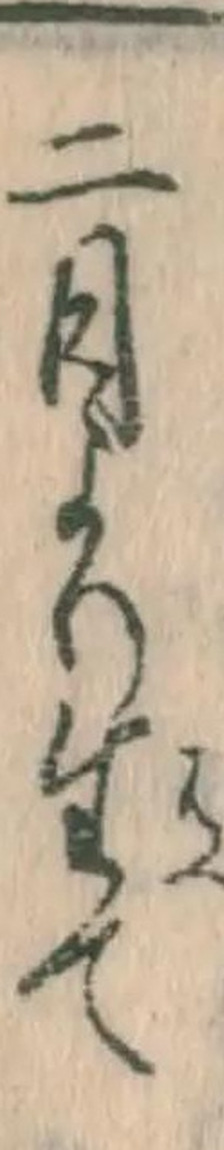二月より生て
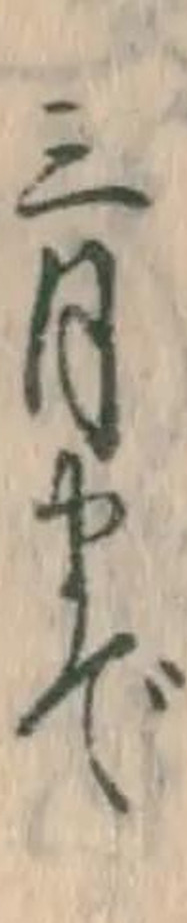三月まで
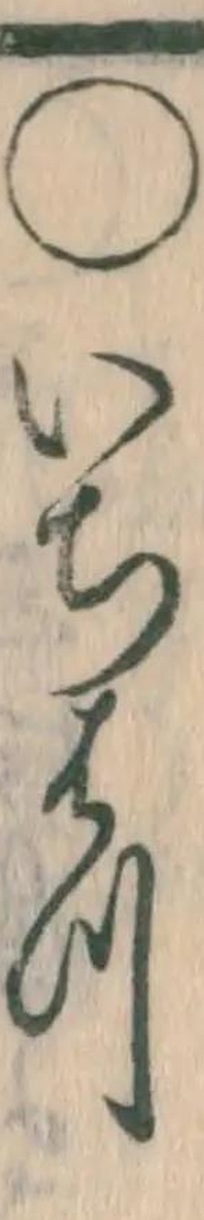〇いちはつ
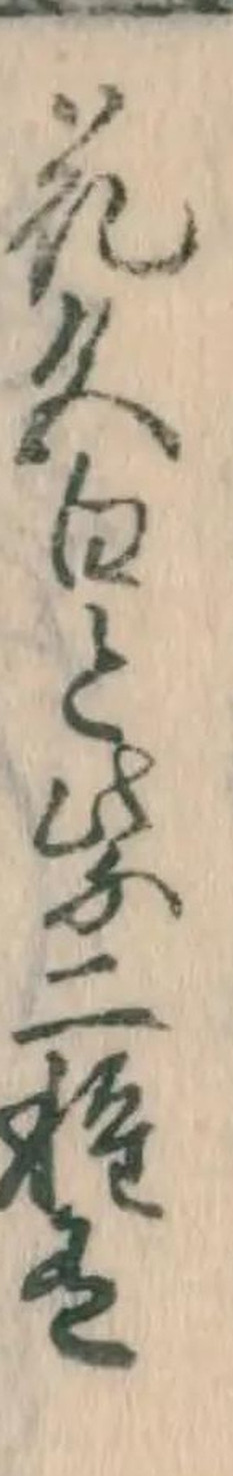花色白と葉二種有
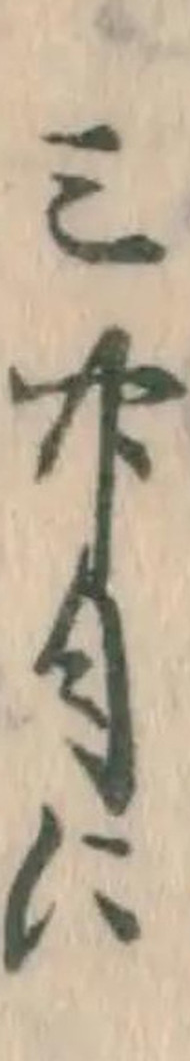三四月に
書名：艸花繪前集. [2]
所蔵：国立国会図書館 National Diet Library, JAPAN
